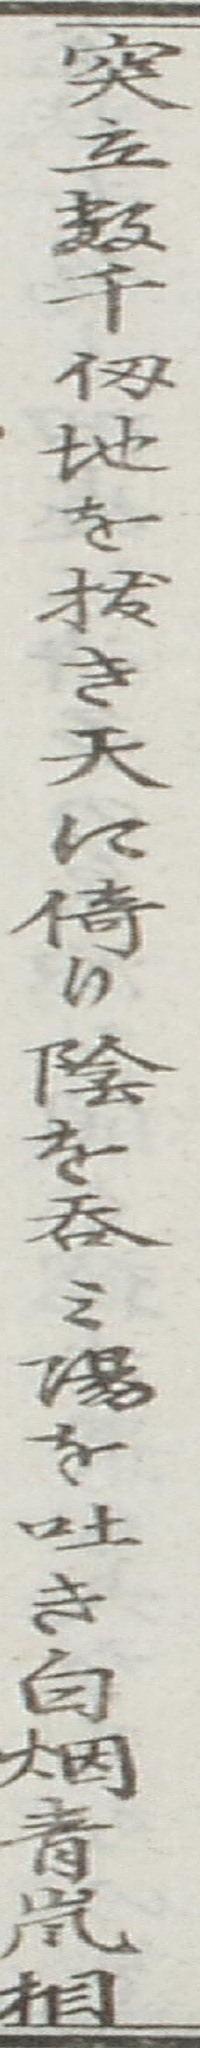突立数千仭地を抜き天に倚り陰を呑み湯を吐き白煙青嵐相
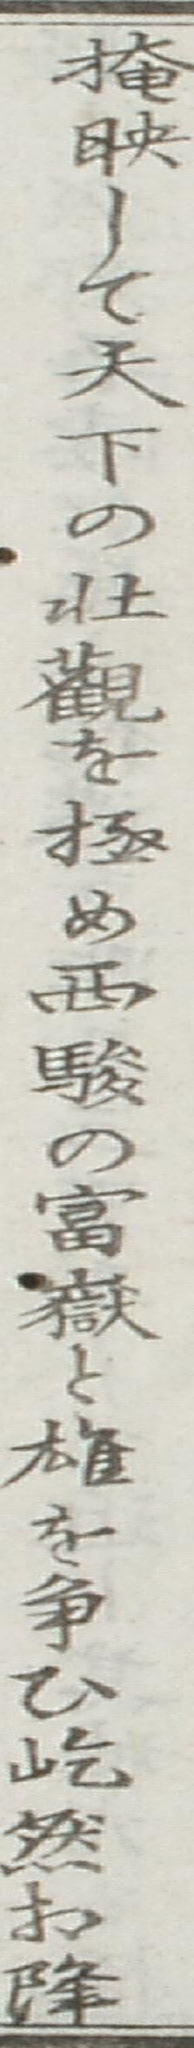掩映して天下の壮観を極め西駿の富嶽と雄を争ひ屹然相降
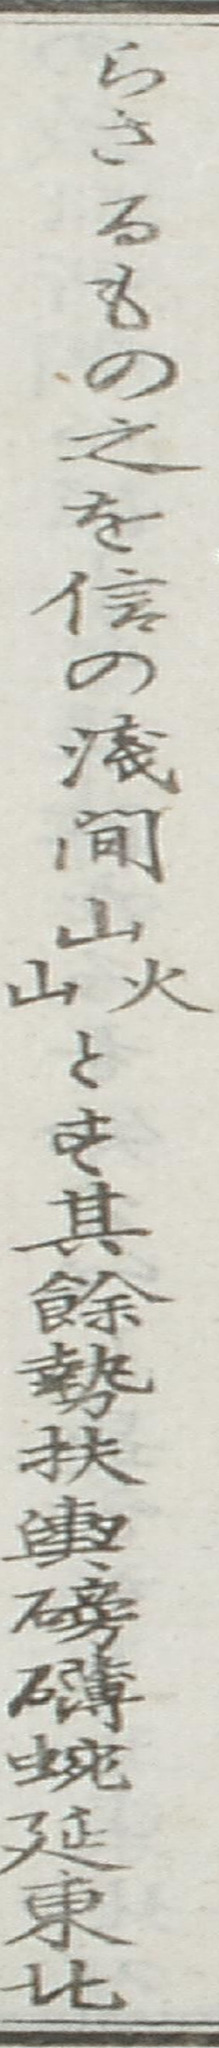らさるもの之を信の浅間山火山とす其余勢扶輿磅礴蜿延東北
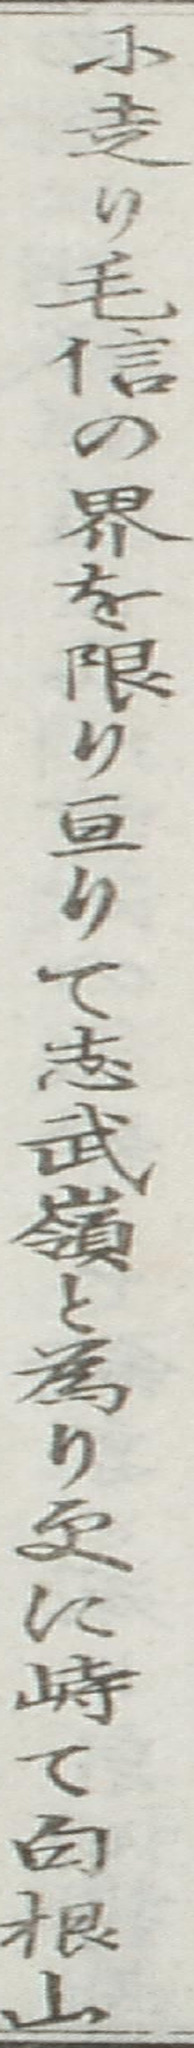に走り毛信の界を限り亘手りて志武嶺と為り更に峙て白根山
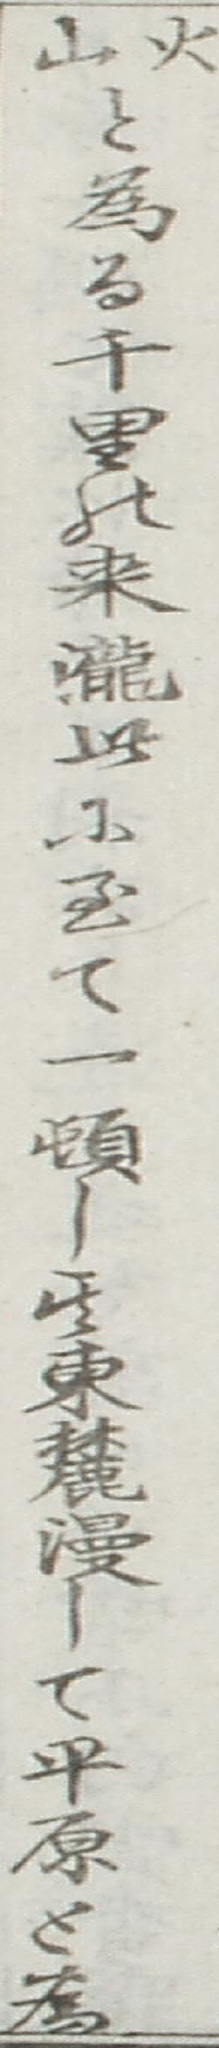火山と為る千里の来瀧此に至て一頓し其東麓漫して平原と為

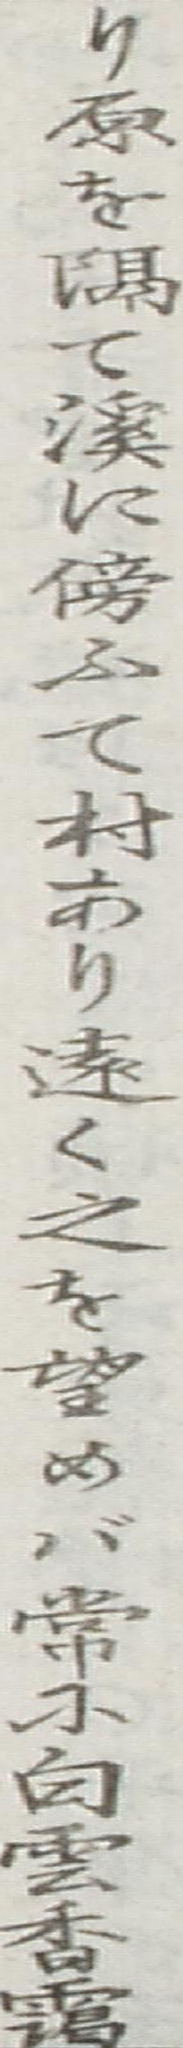り原を隔て渓に傍ふて村あり遠く之を望めば常に白雲香靄
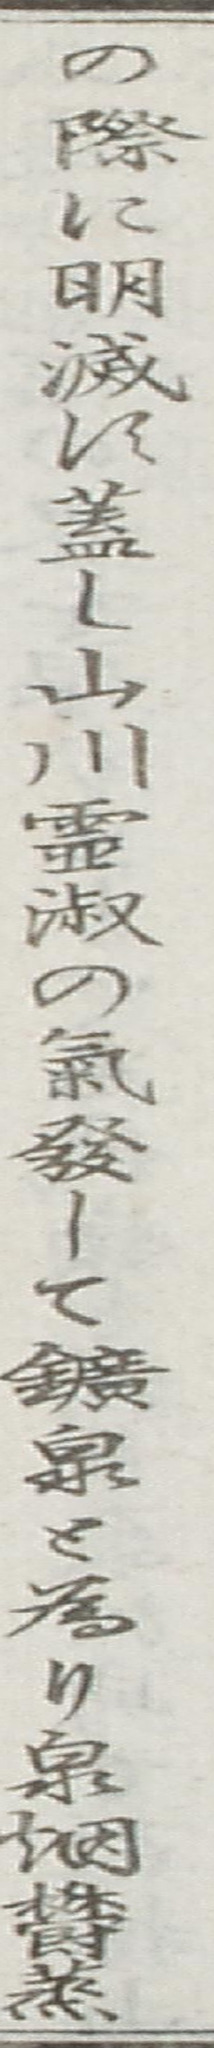の際に明滅す蓋し山川霊淑の氣發して鑛泉と為り泉烟欝蒸
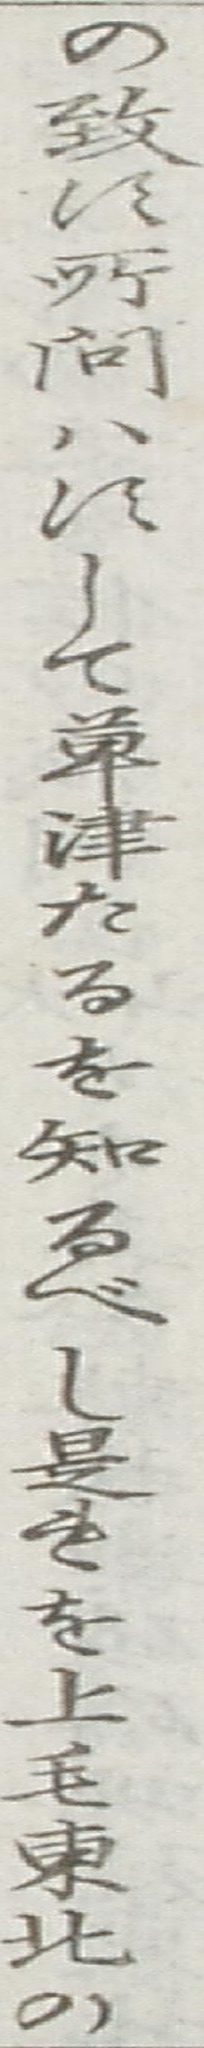の致す所問はすして草津たるを知るべし是れを上毛東北の
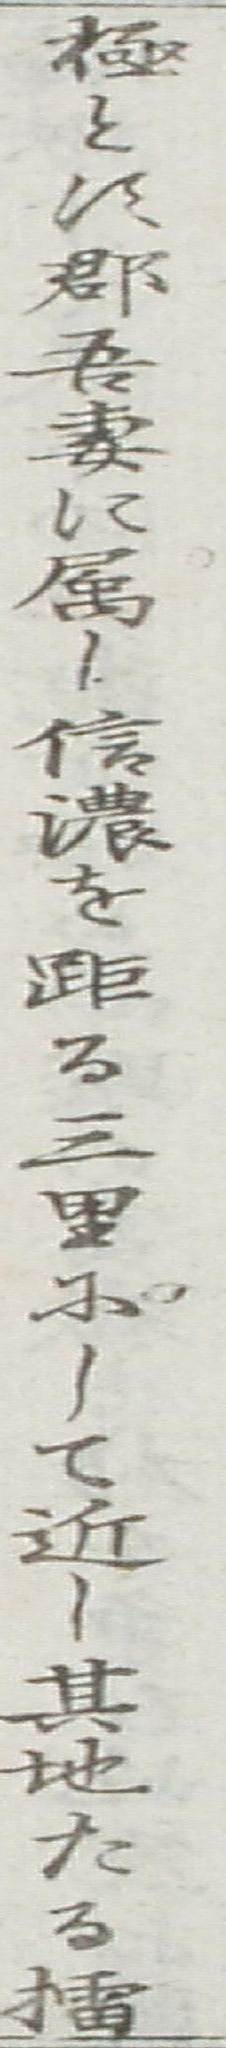極とす郡吾妻に属し信濃を距る三里にして近し其地たる檑
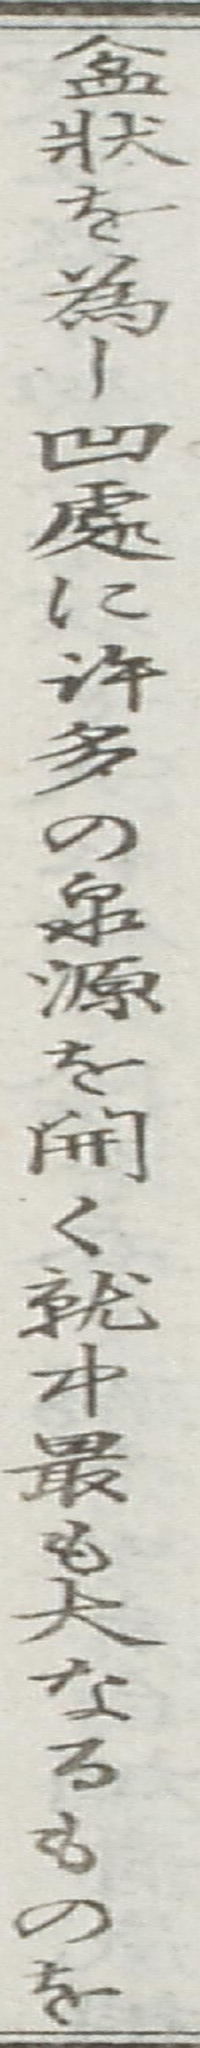盆状を為し凹處に許多の泉源を開く就中最も大なるものを
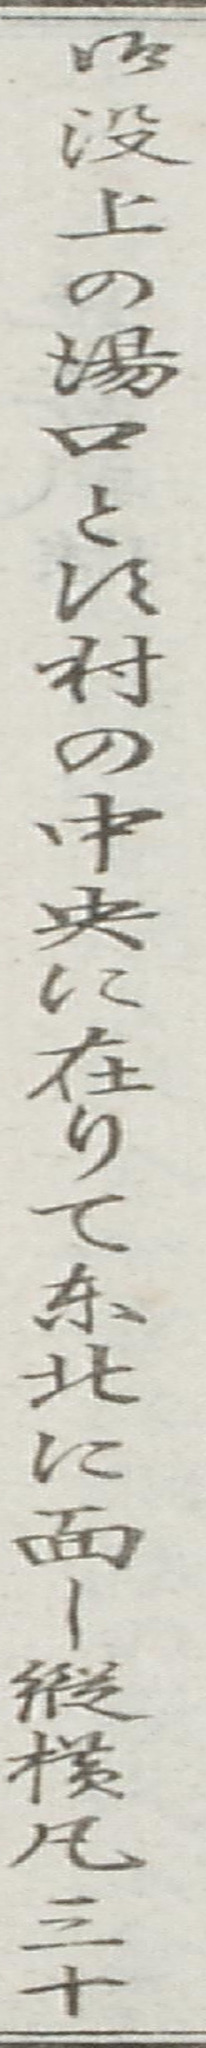此没上の湯口とす村の中央に在りて東北に面し縦横凡三十
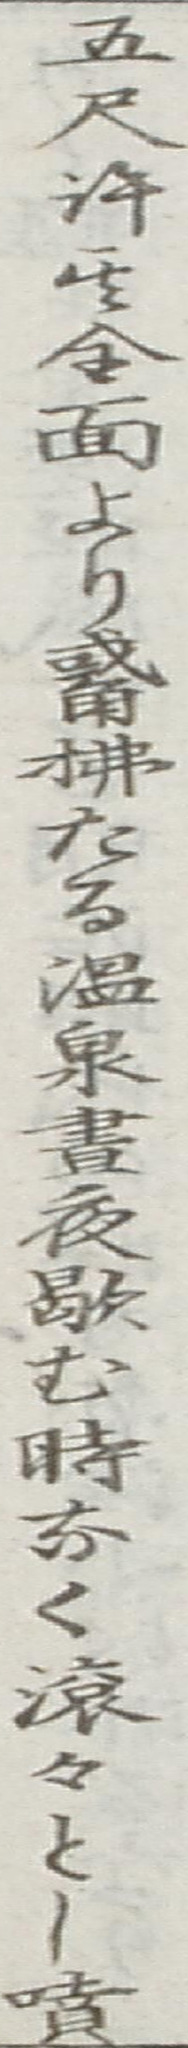五尺許其全面より觱拂たる温泉晝夜歇む時なく滾々とし噴
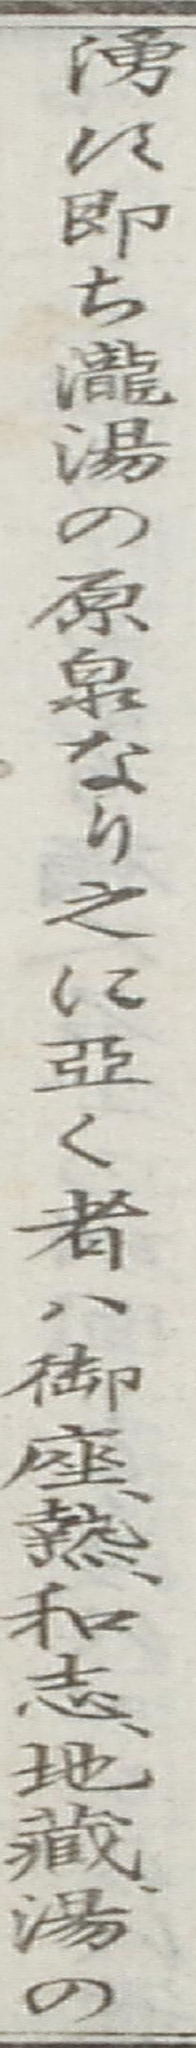湧す即瀧湯の原泉なり之に亞く者は御座、熱、和志、地蔵湯の
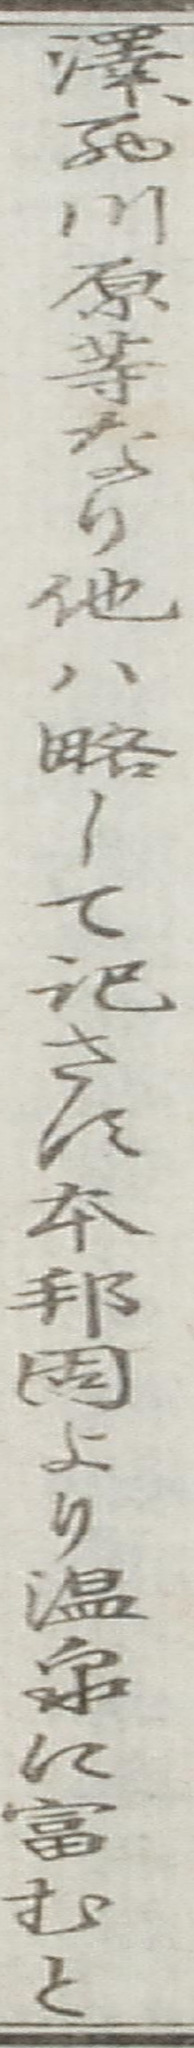澤にや川原等なり他は略して汜さす本邦因より温泉に富むと
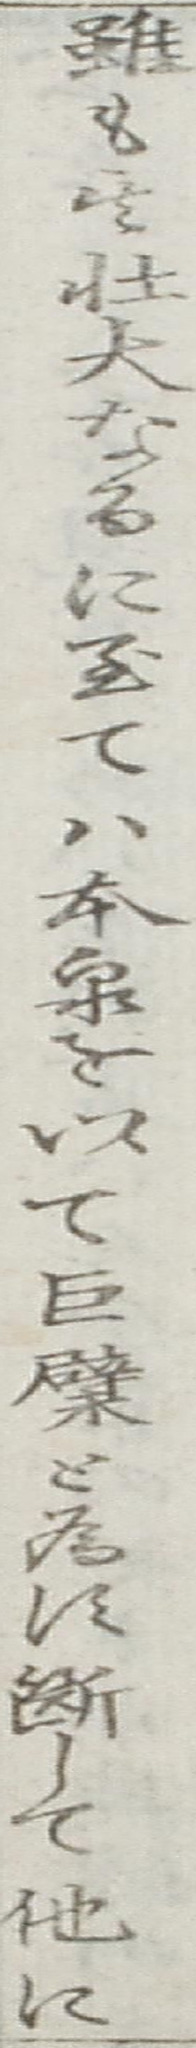雖も其壮大なるに至ては本泉を以て巨璧と為す断して他に
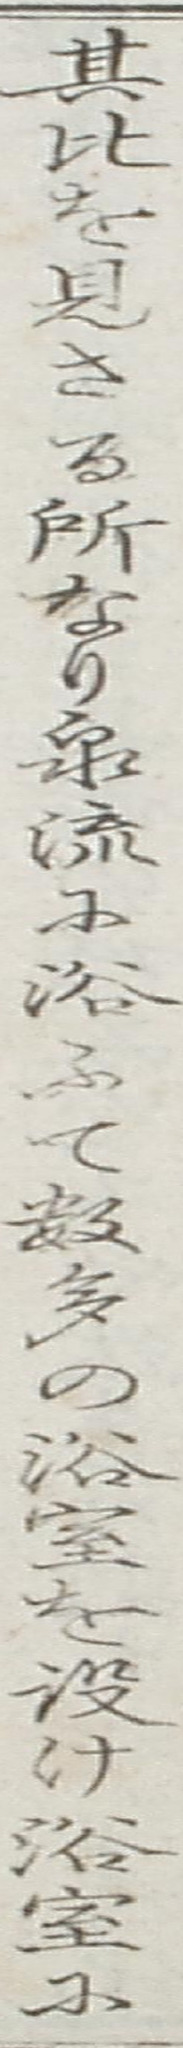其比を見さる所なり泉流に浴ふて数多の浴室を設け浴室に
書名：草津温泉誌　全
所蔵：東京大学地震研究所図書室 Earthquake Research Institute Library, The University of Tokyo, JAPAN
